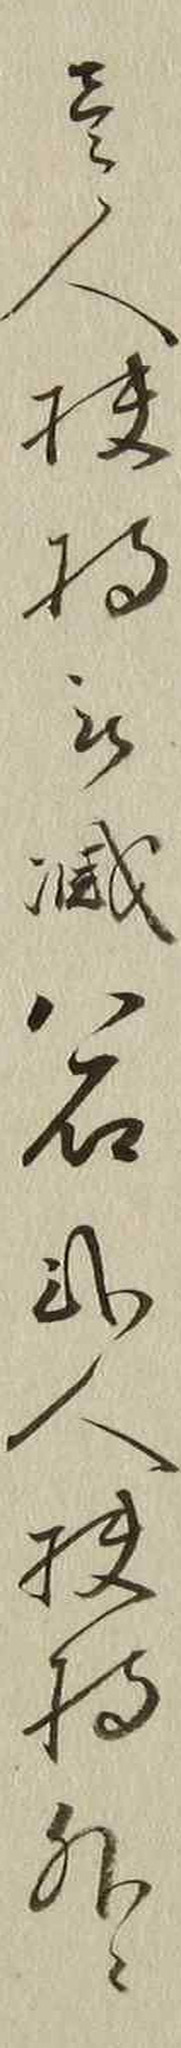壱人扶持被減八石弐人扶持外ニ
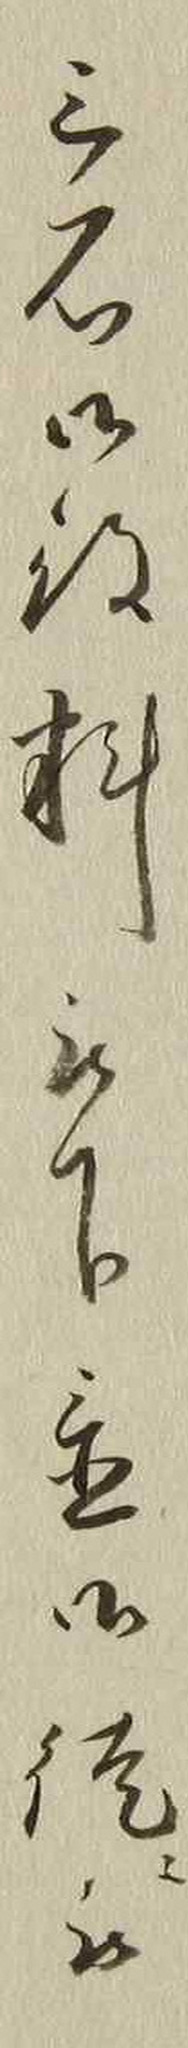三石御役料被下置御徒ニ被
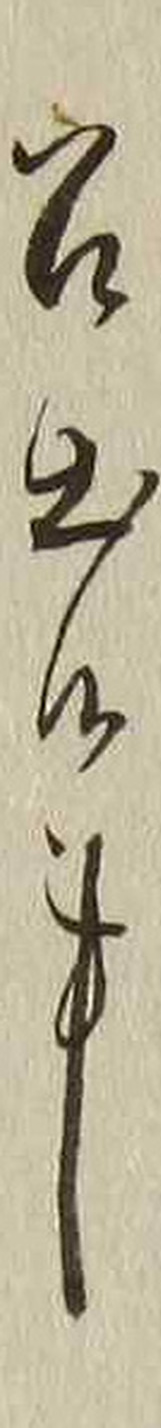召出候事
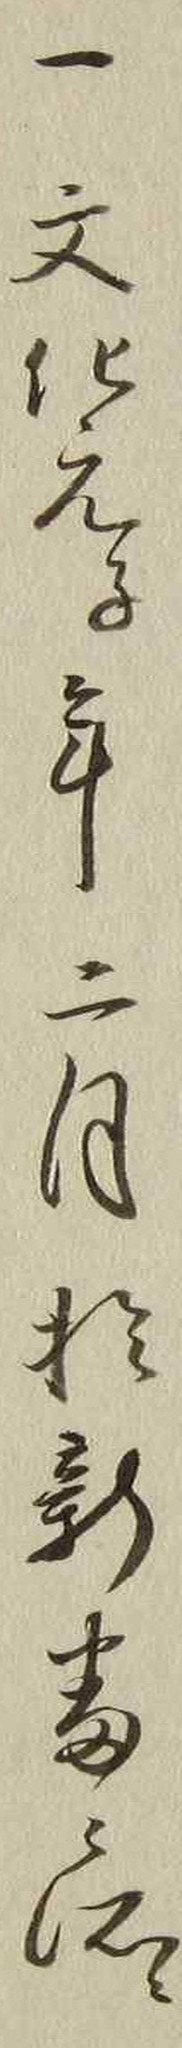一文化元子年二月於新番々所ニ
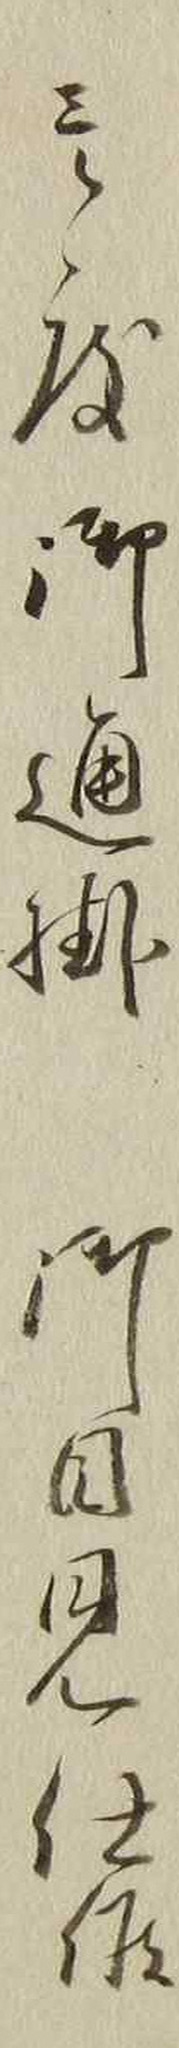壱度御通掛御目見仕候
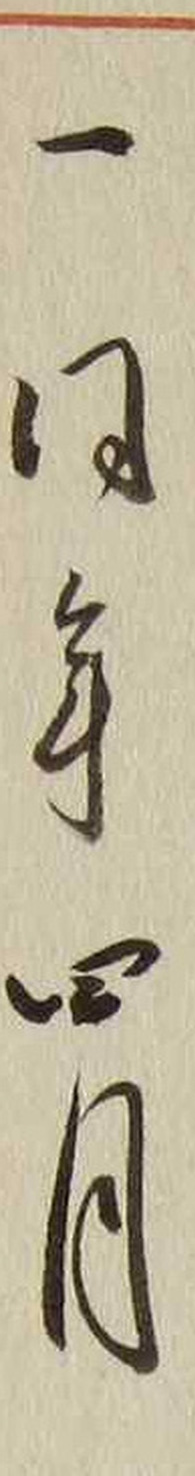一同年四月
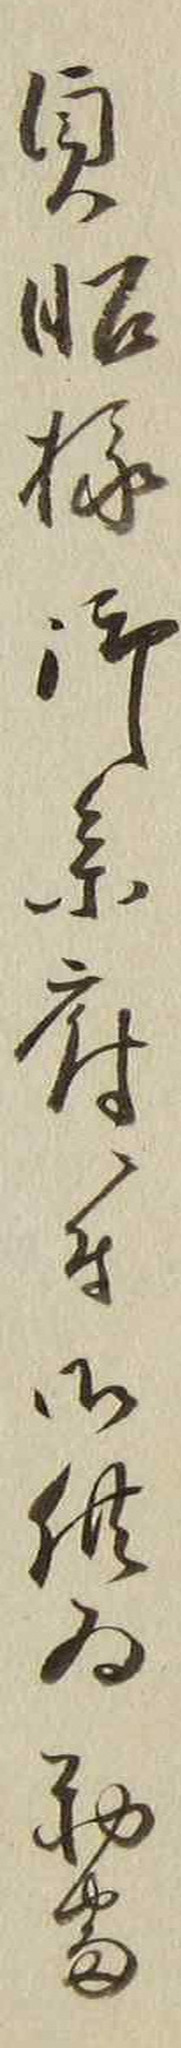貞昭様御参府ニ付御供為勤番
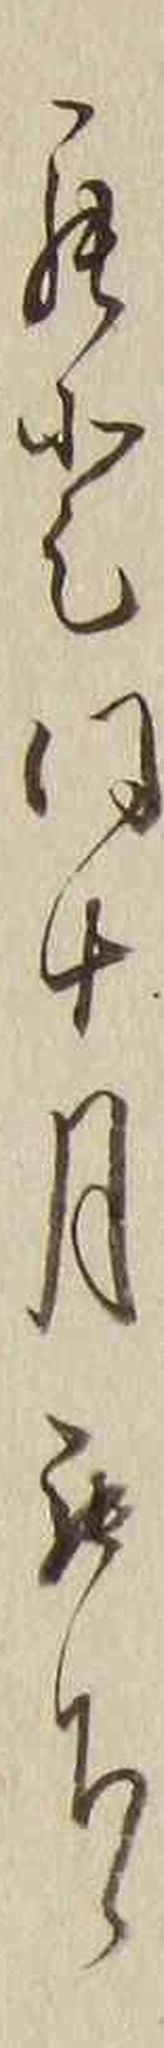罷登同十月罷下候

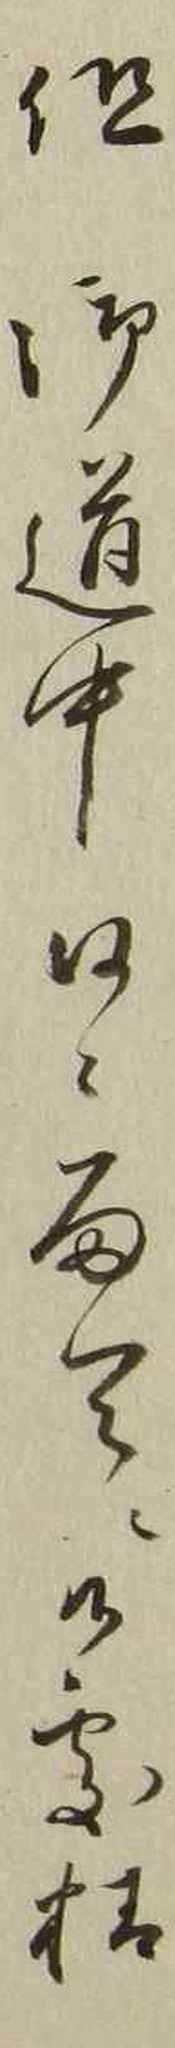但御道中日々雨天ニ候処精
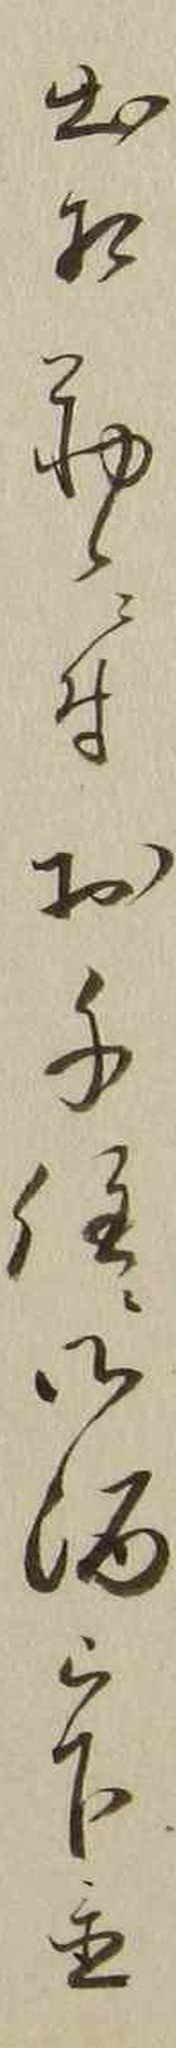出相勤候ニ付於千住ニ御酒被下置
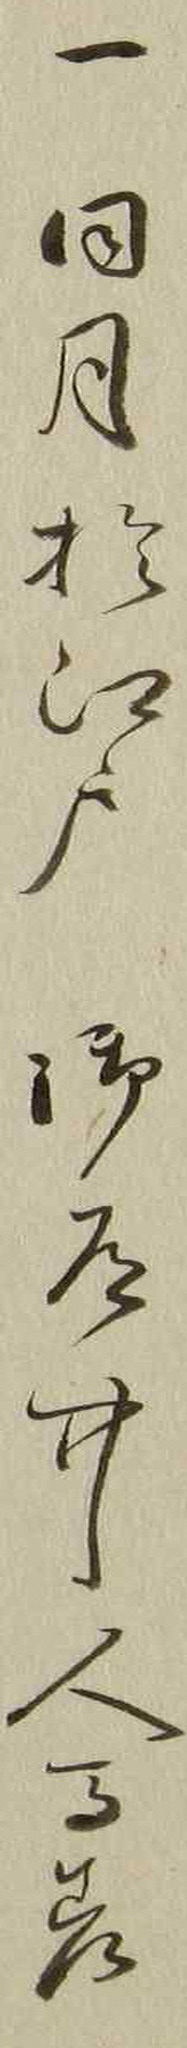一同月於江戸御道中人馬差
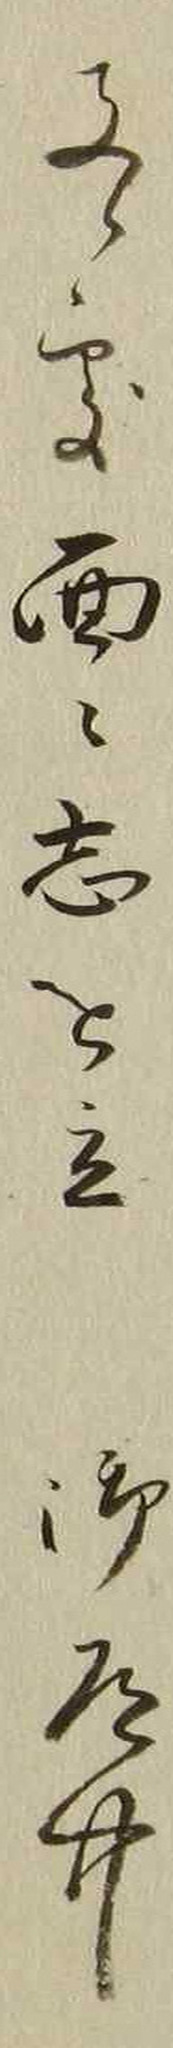支候処面々志を立御道中
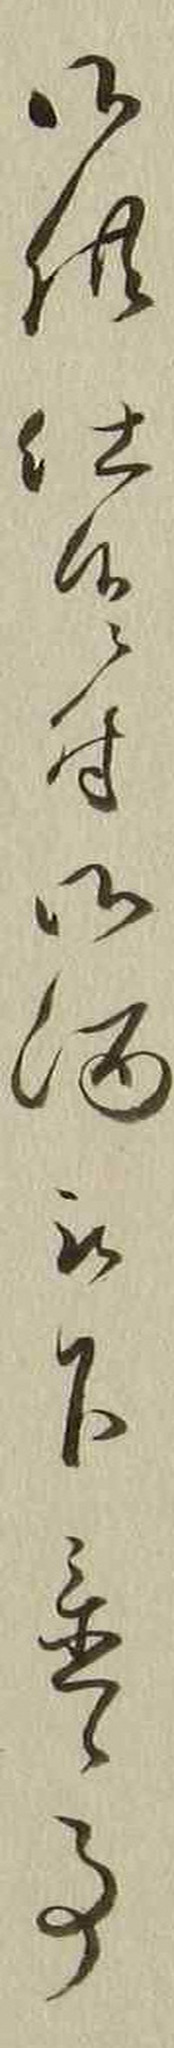御供仕候ニ付御酒被下置候事
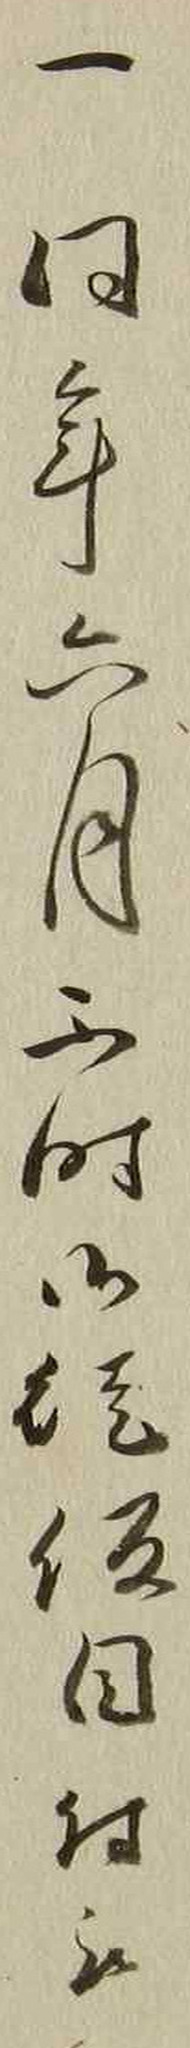一同年六月不時御徒仮目付被
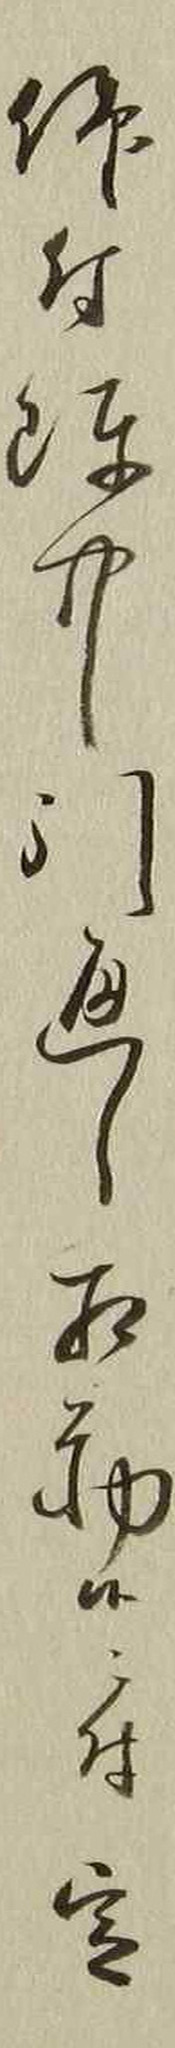仰付陣中引通し相勤候ニ付定
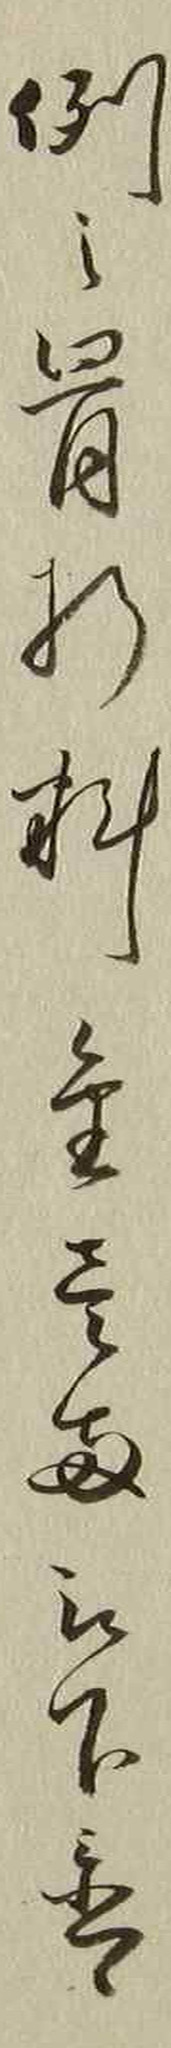例之骨折料金壱両被下置候
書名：諸士系譜　巻之52　に之部3
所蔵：会津若松市立会津図書館
